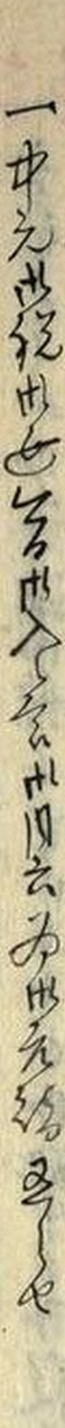一中元御祝御延今日御入候節御目六為御取替有之由
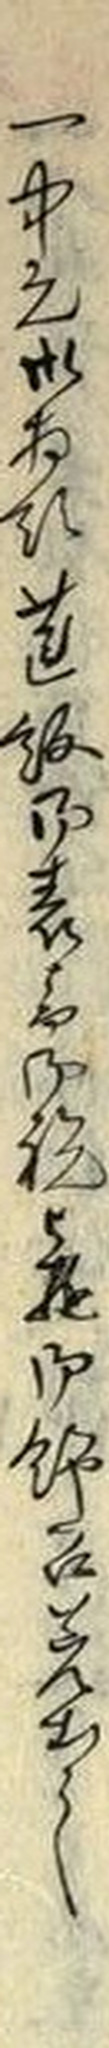一中元御拝領蓮飯御表ニ而御祝被遊御飾台差出之
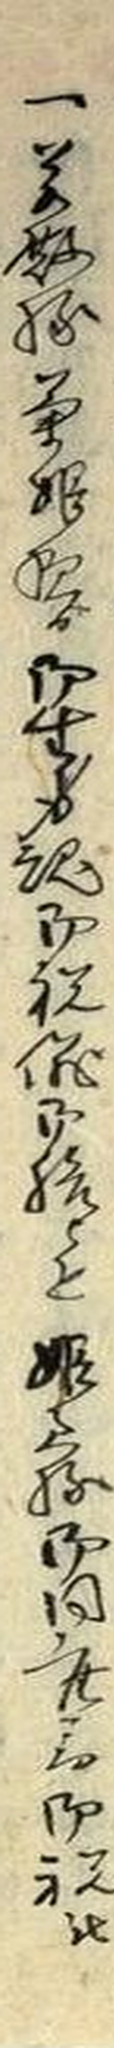一若殿様菊姫様ゟ御生身魂御祝儀御膳被進姫君様御同座ニ而御祝被
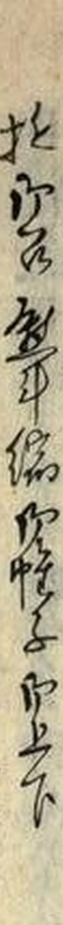遊御召熨斗縮御帷子御上下
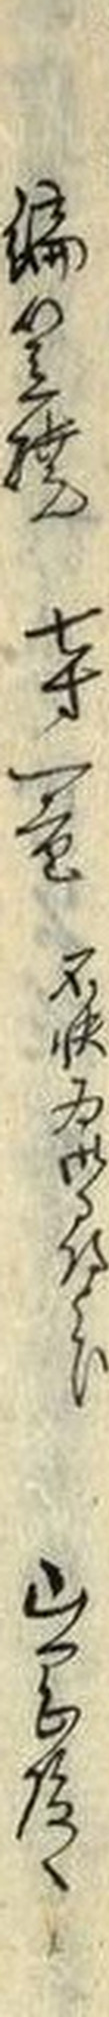編笠焼七寸一重不快為御尋被下山岡殿へ
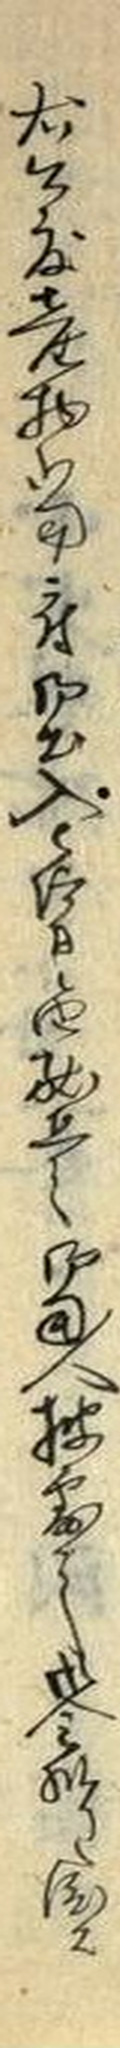右今度産物御用ニ付御出入被仰付候由献上之御用人披露之御金掛へ渡ス

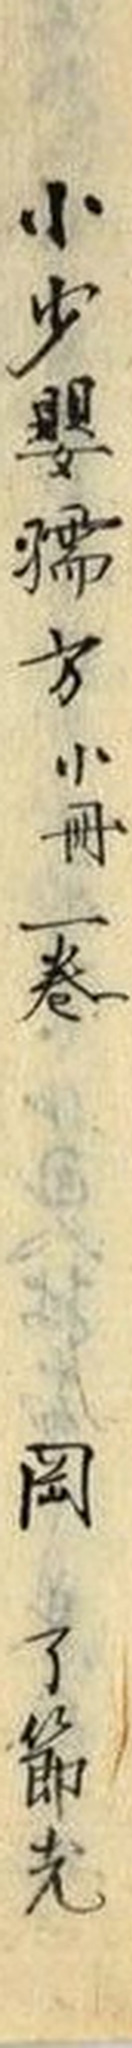小少嬰臍方小冊一巻岡了節老
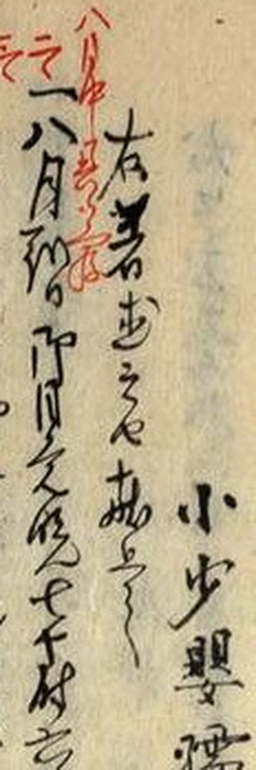右著述之由献上之
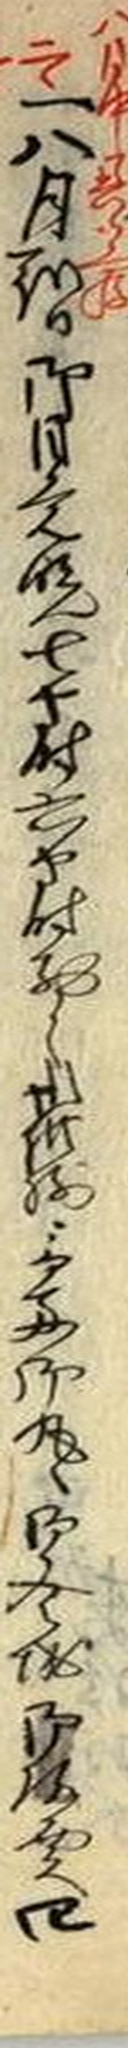一八月朔日御目覚暁七半時六半時前之御供揃二而両御丸へ御登城御帰殿四
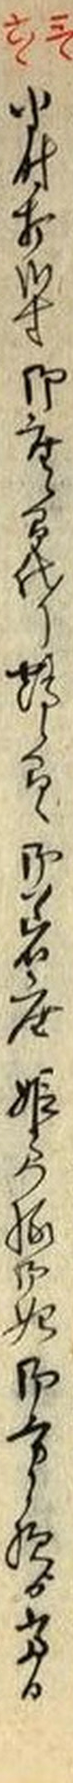半時打弐寸御座之間代り鶴之間へ御着座姫君様御始御方々様ゟ当日
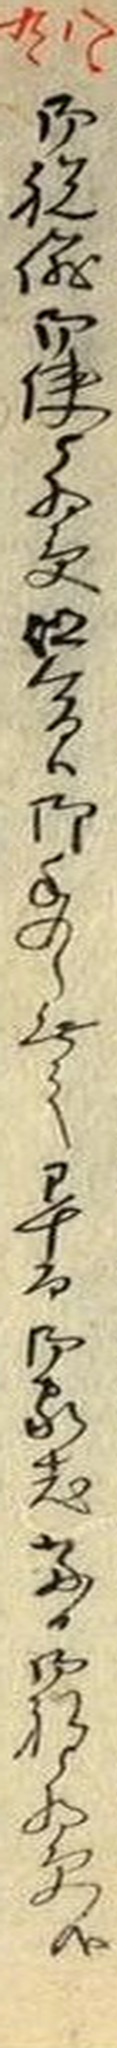御祝儀御使被為受但今日ハ御手のし無之畢而御家老当日御礼被為受候
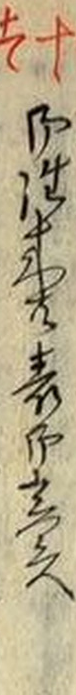御往来共表御玄関
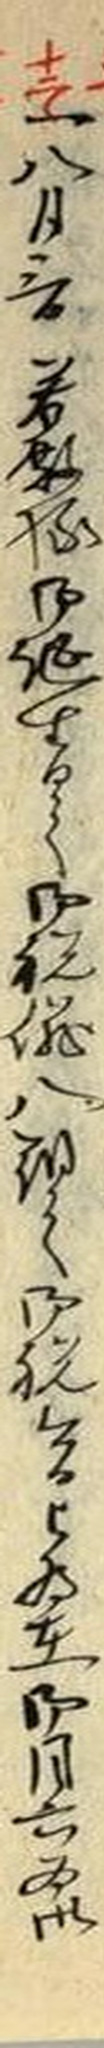一八月三日若殿様御誕生日之御祝儀八朔之御祝今日被為在御目六為御
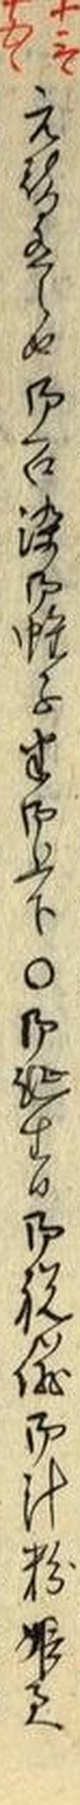取替有之候由御召染御帷子半御上下○御誕生日御祝儀御汁粉姫君
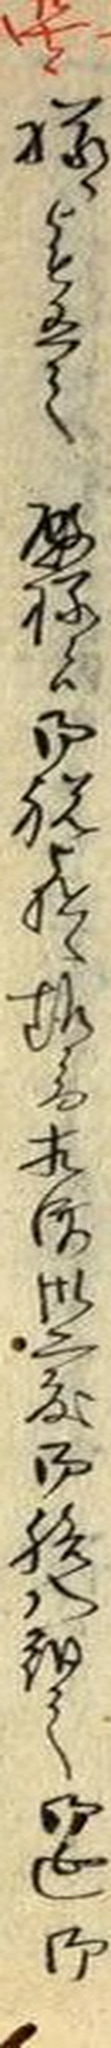様へ被進有之殿様ニハ御祝被遊候趣ニ而相済御二度御膳八朔之御廻御
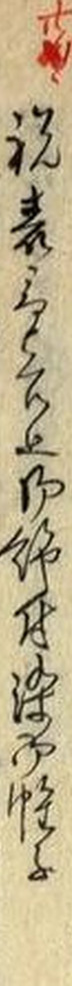祝表ニ而被召上御飾付染御帷子
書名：少傅日録抄（斉承付側向頭取日記、在府）
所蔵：福井県文書館 Fukui Prefectural Archives
